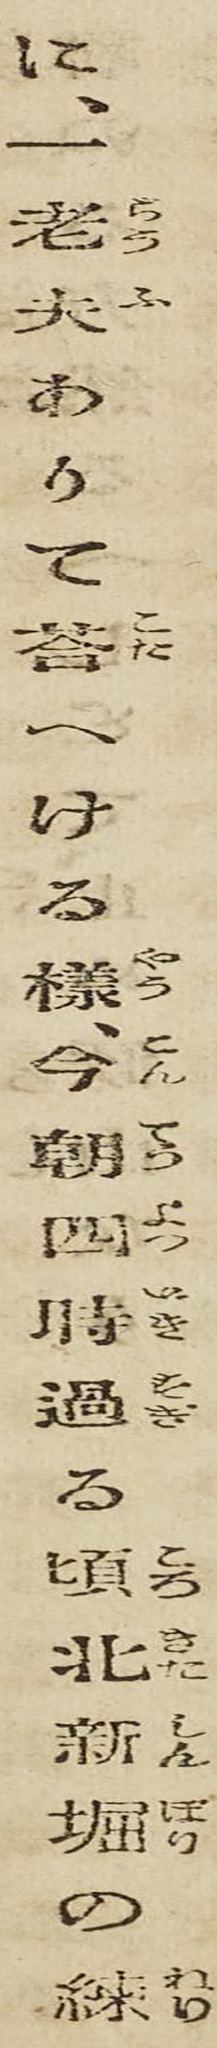に、一老夫ありて答へける様、今朝四時過る頃北新堀の練
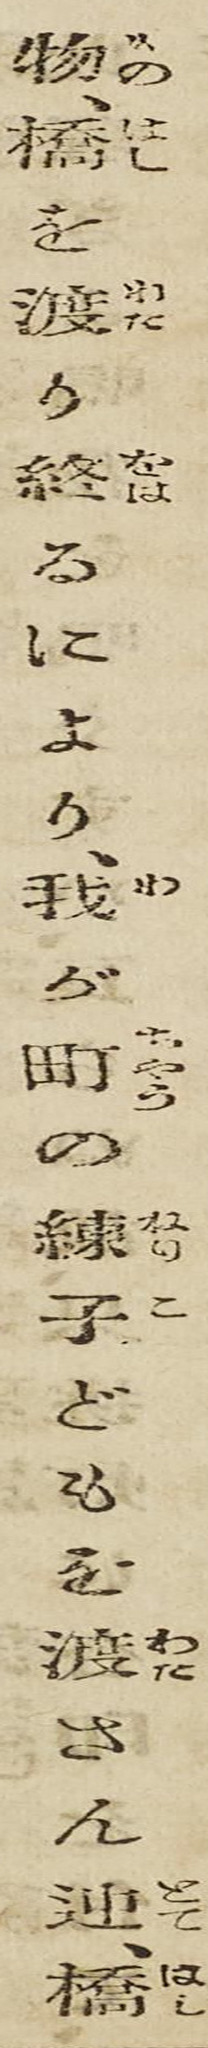物、橋を渡り終るにより、我が町の練子どもを渡さん迚、橋
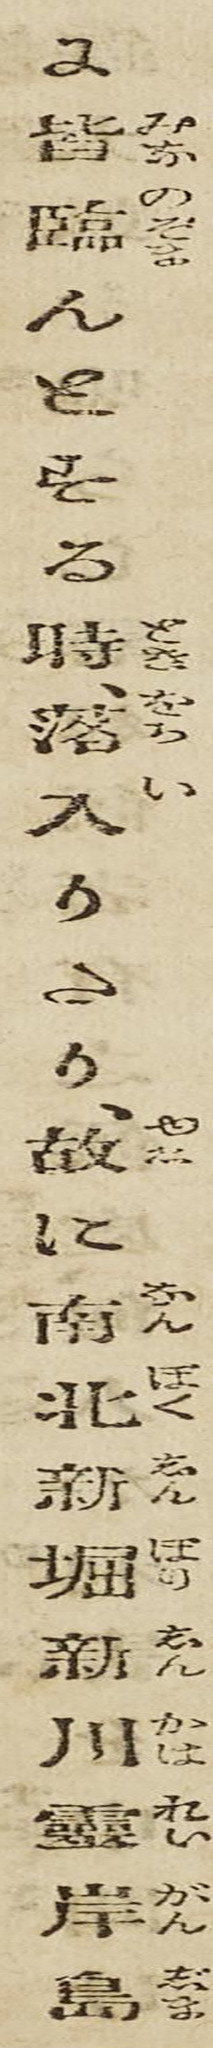に皆臨んとする時、落入りたり、故に南北新堀新川霊岸島
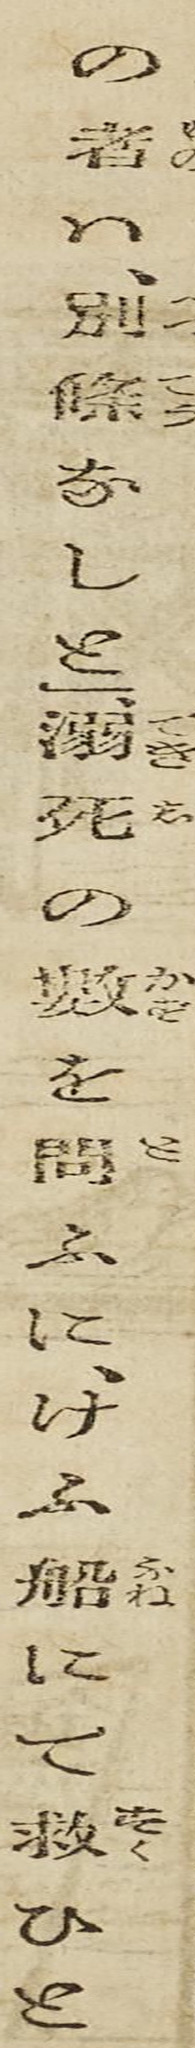の者は、別條なしと」、溺死の数を問に、けふ船にて救ひと
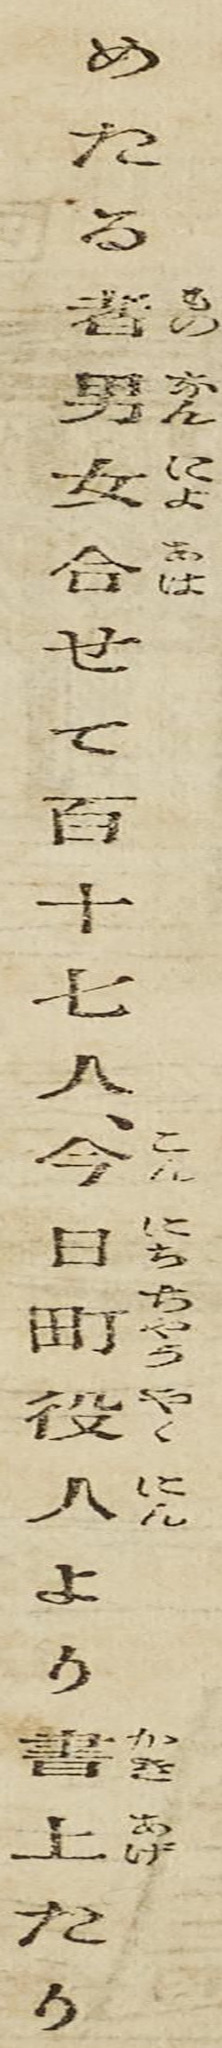めたる者男女合せて百十七人、今日町役人より書上たり
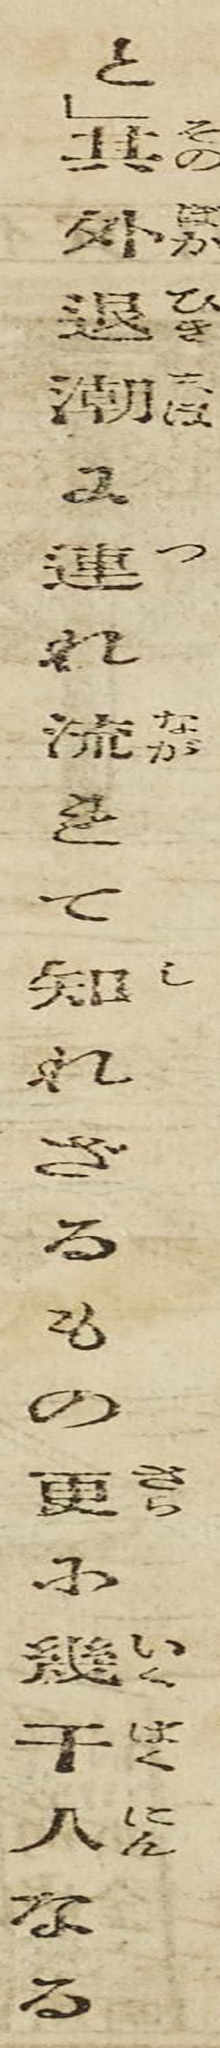と」其外退潮に連れ流れて知れざるもの更に幾干人なる
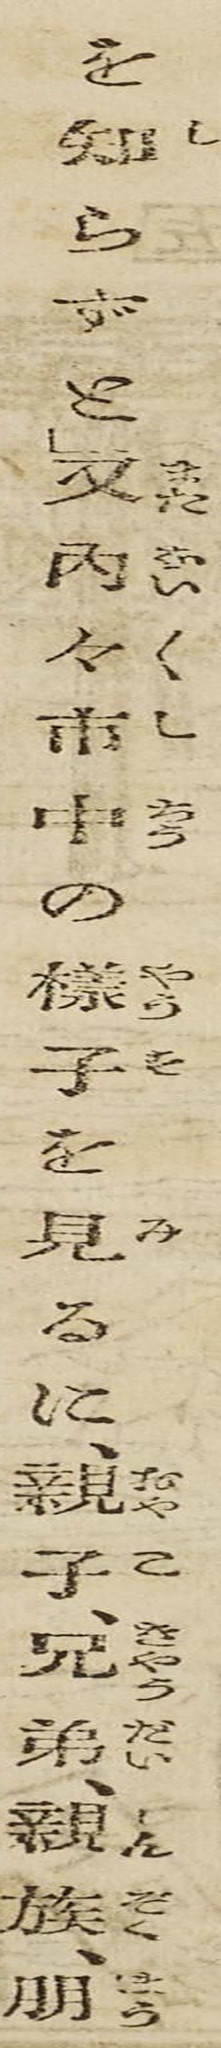を知らずと」又内々市中の様子を見るに、親子、兄弟、親族、朋
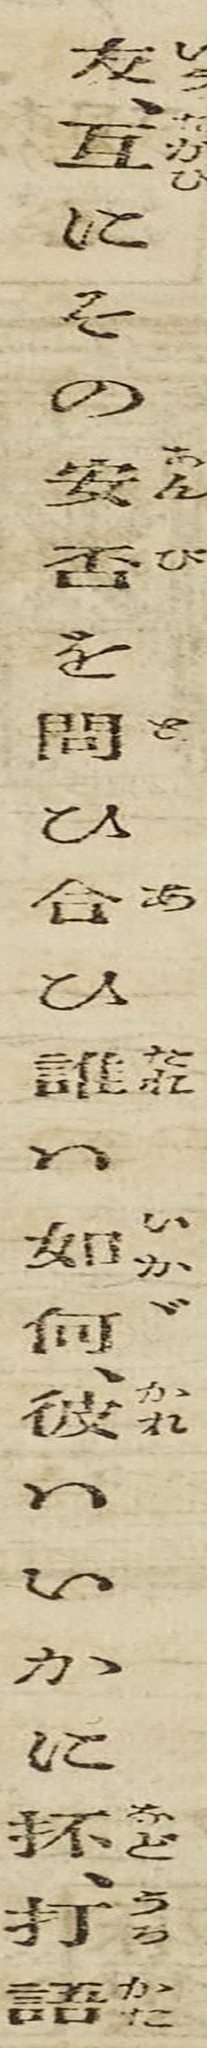友、互にその安否を問ひ合ひ誰は如何、彼はいかに抔、打語
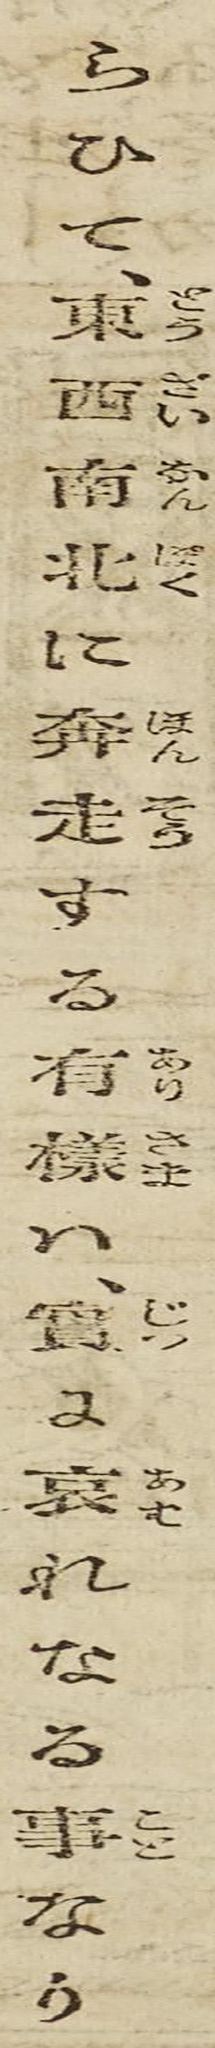らひて、東西南北に奔走する有様は、実に哀れなる事なり
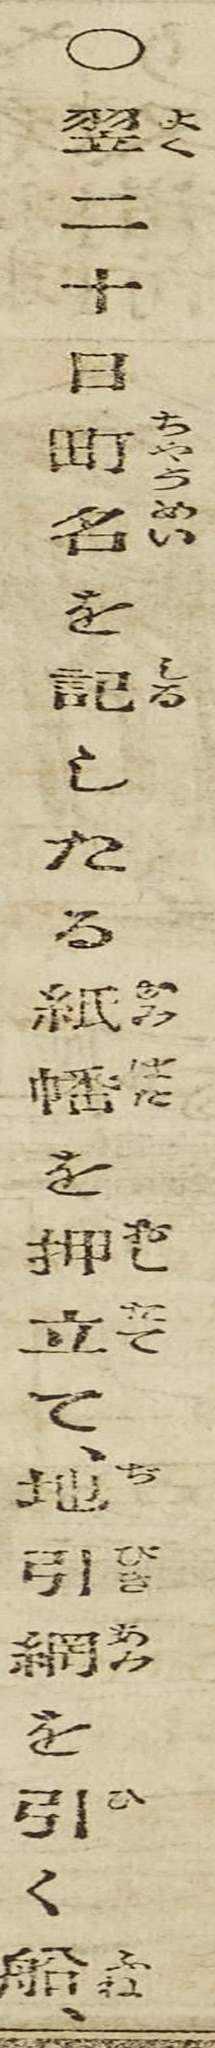○翌二十日町名を記したる紙幡を押立て、地引網を引く船、
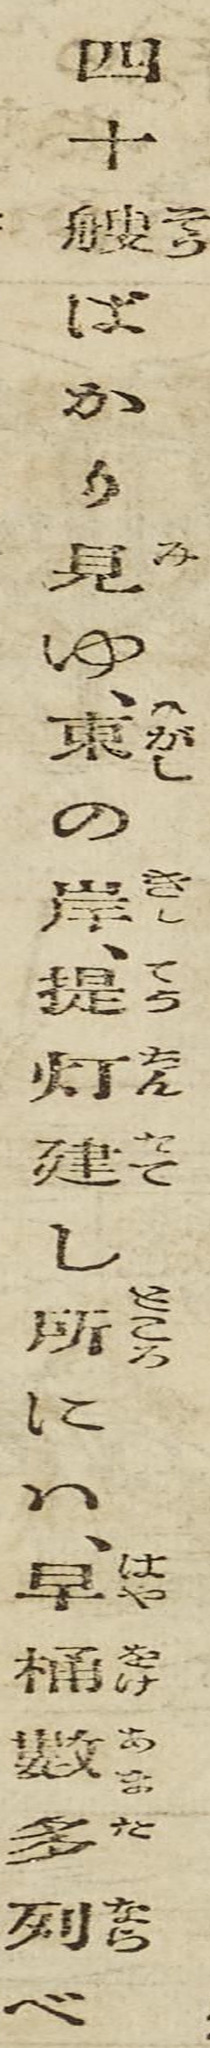四十艘ばかり見ゆ、東の岸、提灯建し所には、早桶数多列べ
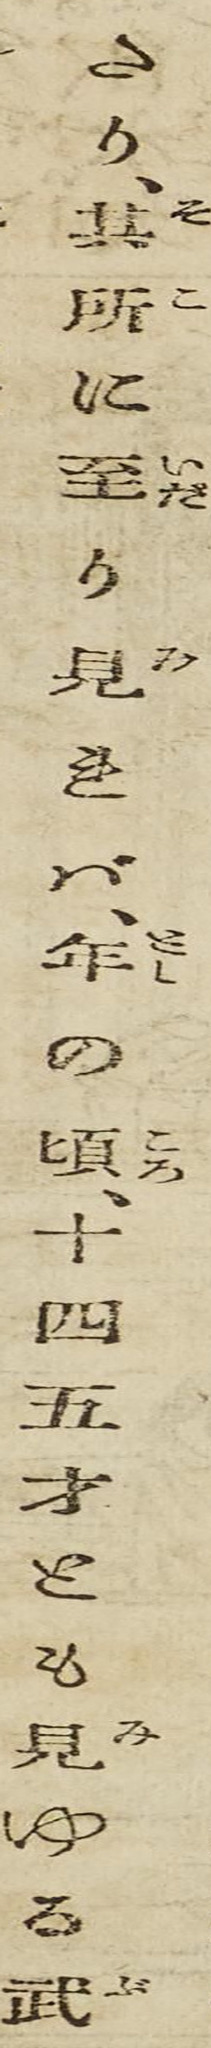たり、其所に至り見れば、年の頃、十四五才とも見ゆる武
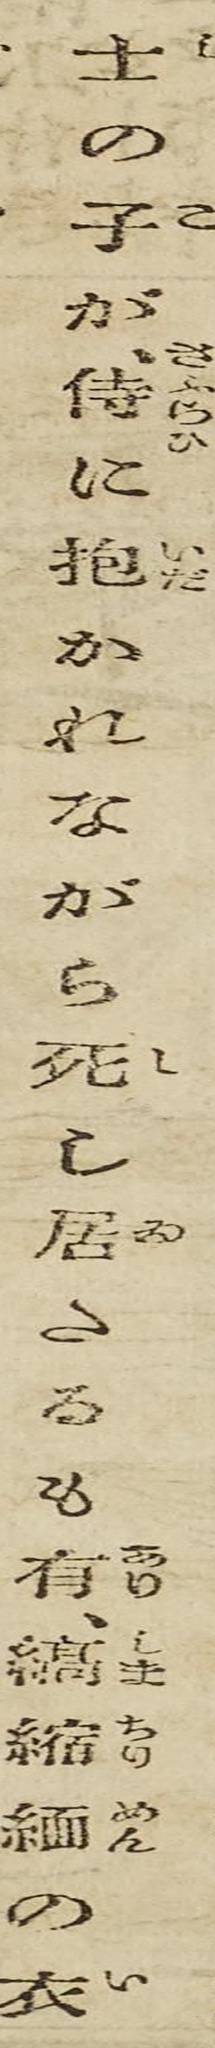士の子が、侍に抱かれながら死し居たるも有、縞縮緬の衣
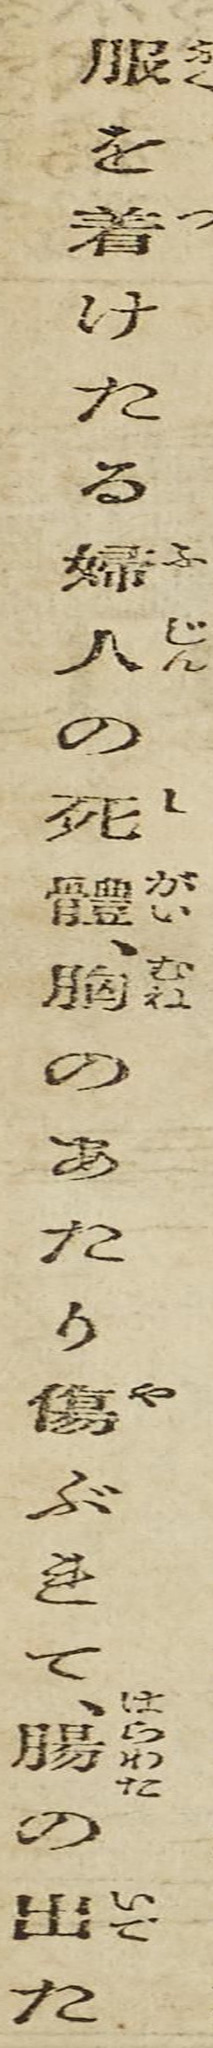服を着けたる婦人の死骸、胸のあたり傷ぶれて、腸の出た

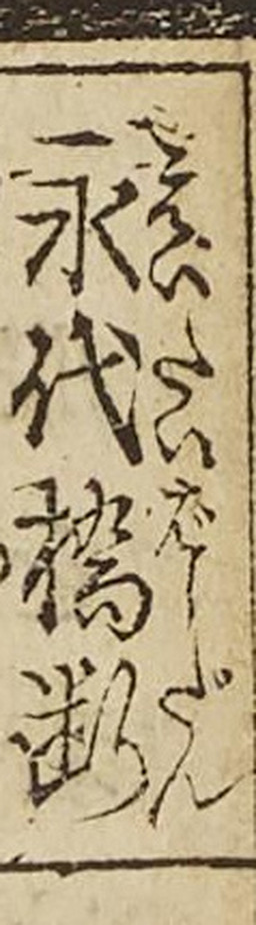永代橋断
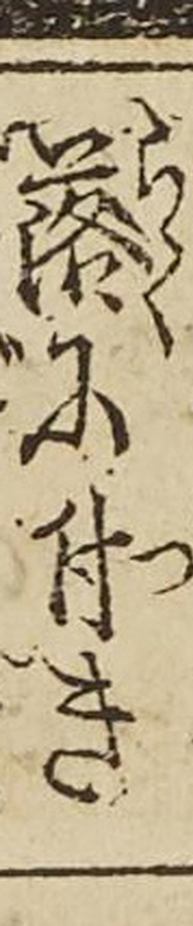落に付き
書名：永代惨話　文化の夢　全
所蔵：東京大学地震研究所図書室 Earthquake Research Institute Library, The University of Tokyo, JAPAN
